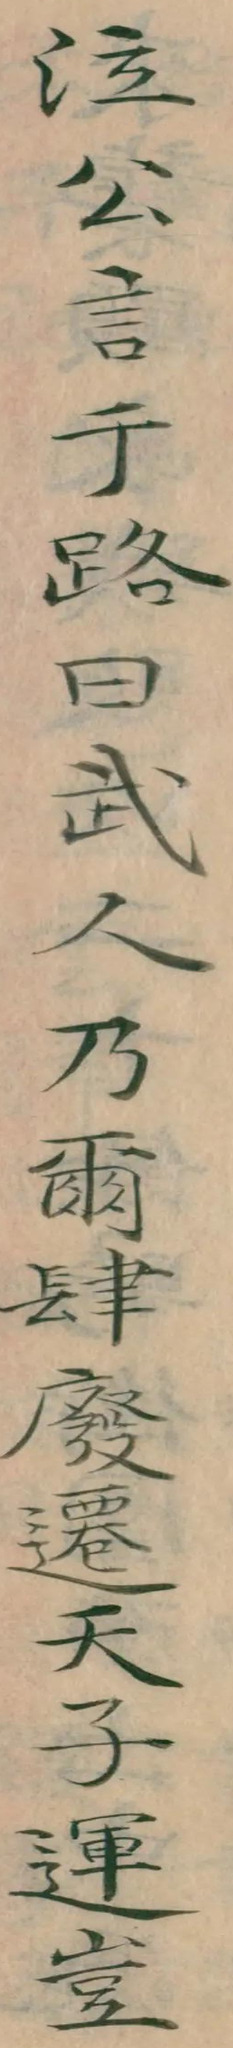泣公言于路曰武人乃爾肆廃遷天子運豈
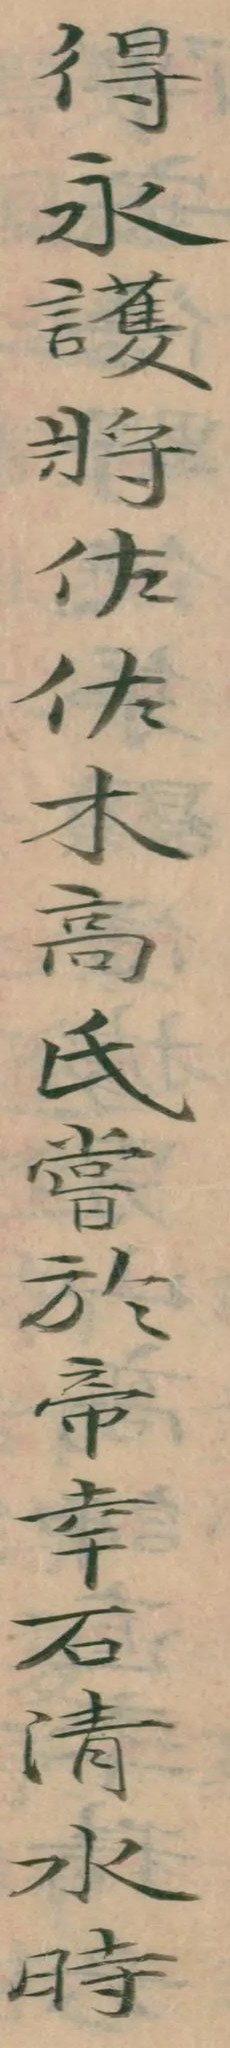得永護将佐佐木高氏嘗於帝幸石清水時
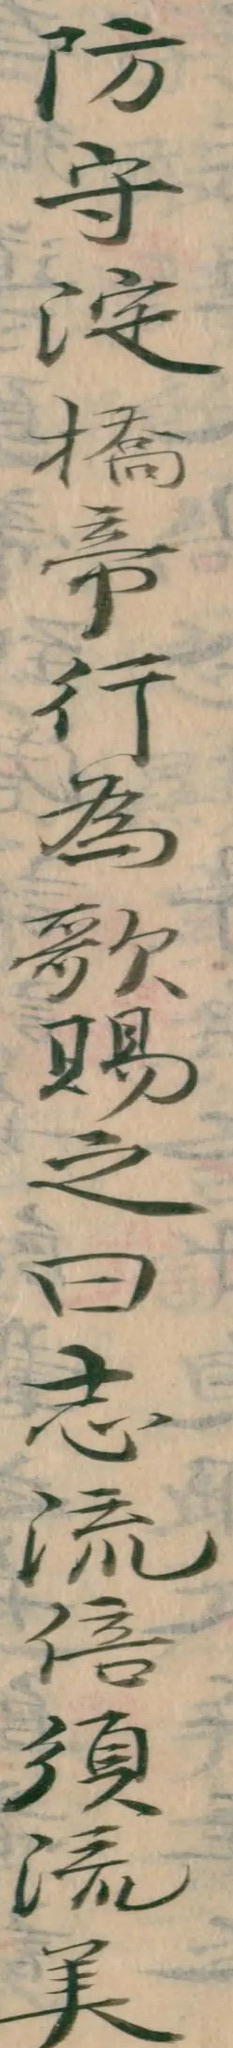防守淀橋帝行為歌賜之曰志流倍須流美
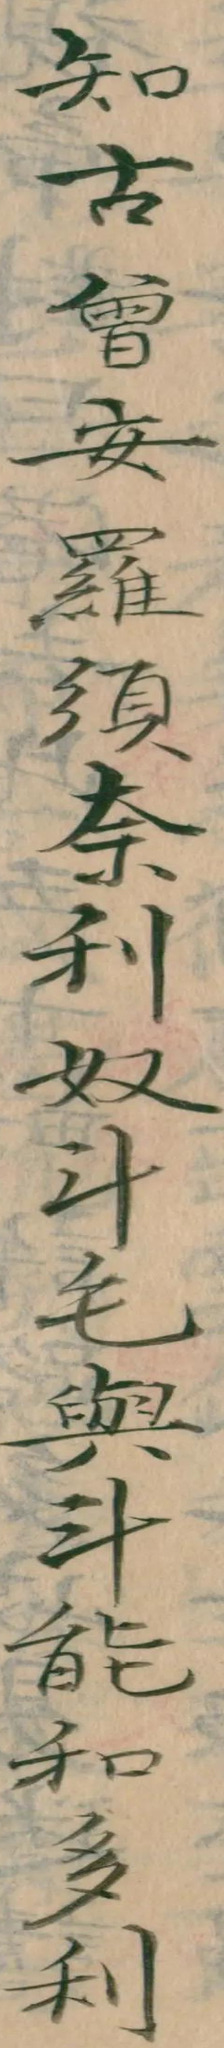知古曽安羅須奈利奴斗毛与斗能和多利
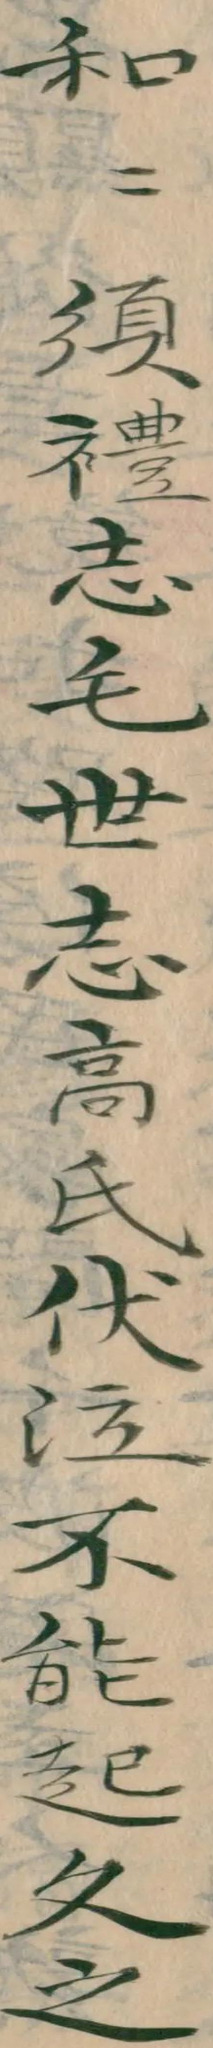和々須礼志毛世志高氏伏泣不能起久之
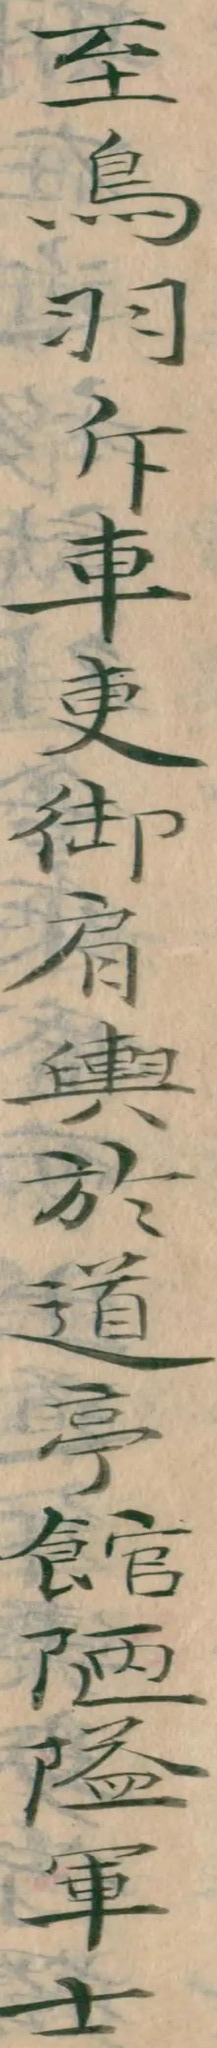至鳥羽斥車更御肩輿於道亭館陋隘軍士
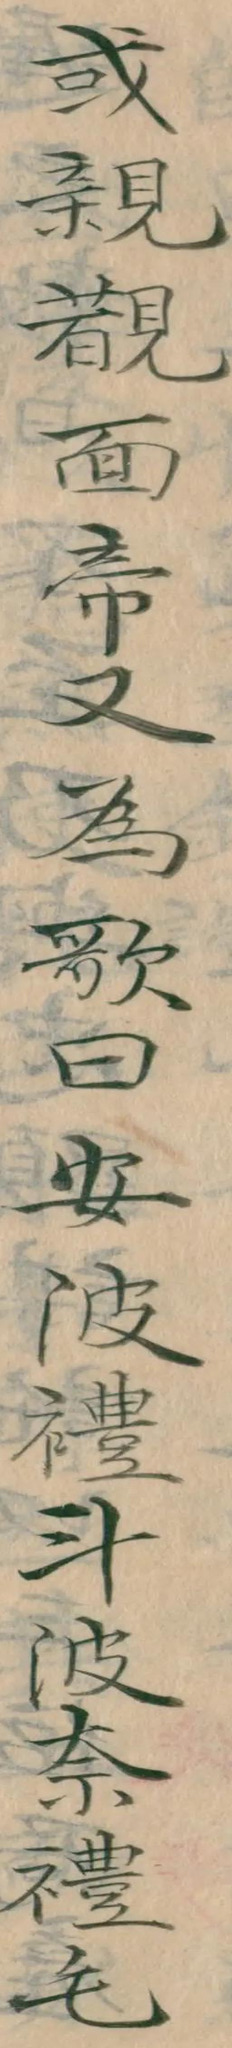或親窺面帝又為歌曰安波礼斗波奈礼毛
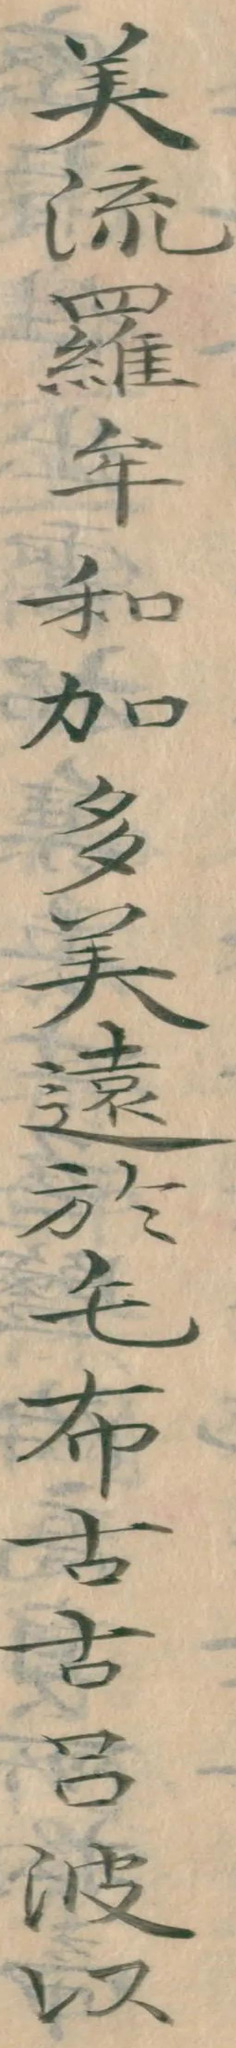美流羅牟和加多美遠於毛布古古呂波以
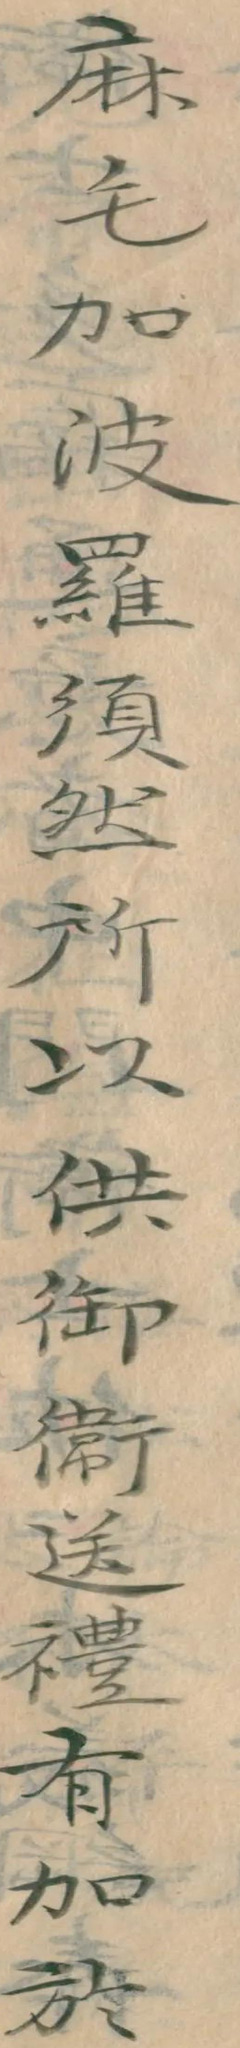麻毛加波羅須然所以供御衛送礼有加於
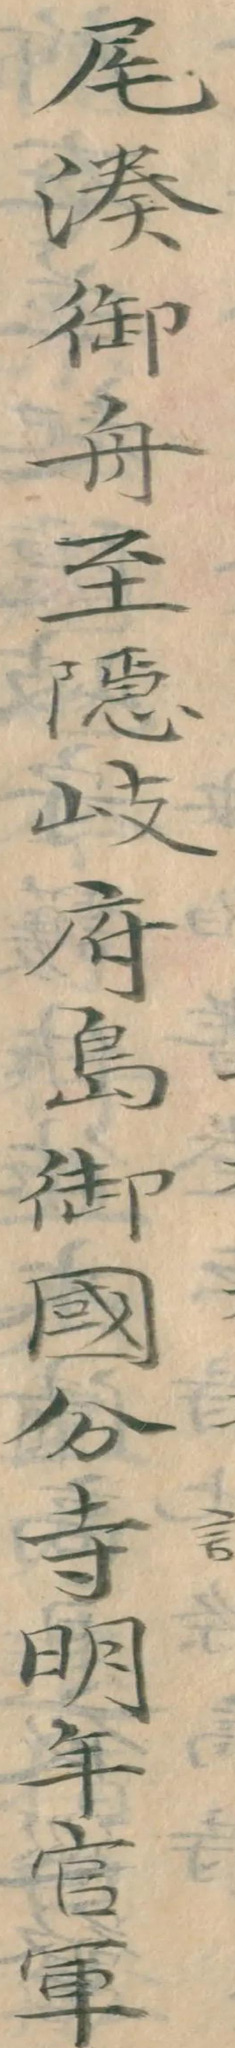尾湊御舟至隠岐府島御国分寺明年官軍

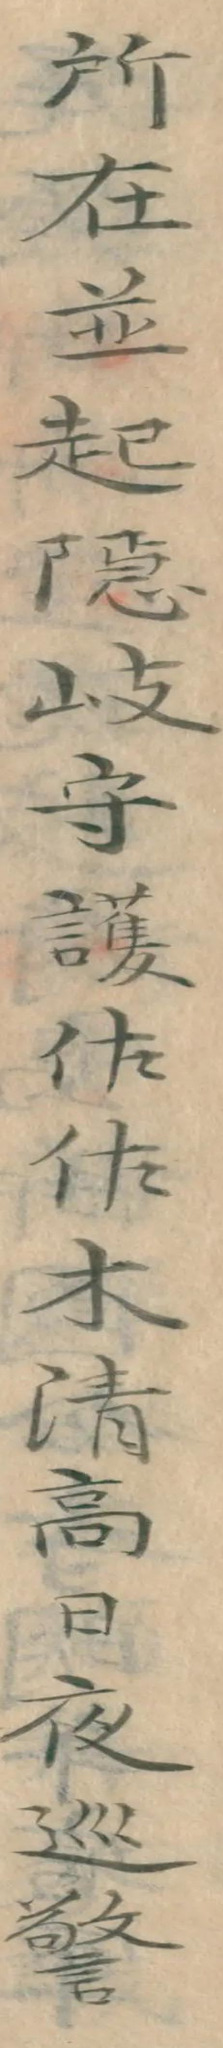所在並起隠岐守護佐佐木清高日夜巡警
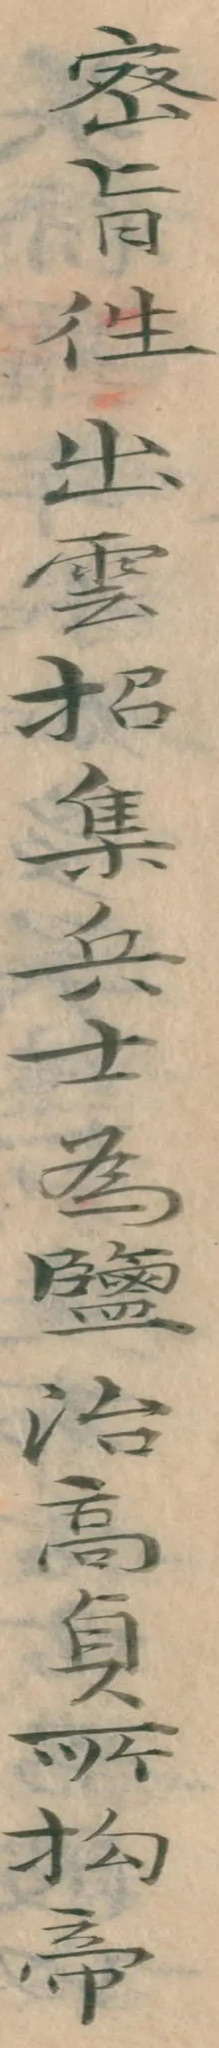密旨往出雲招集兵士為塩治高貞取抅帝
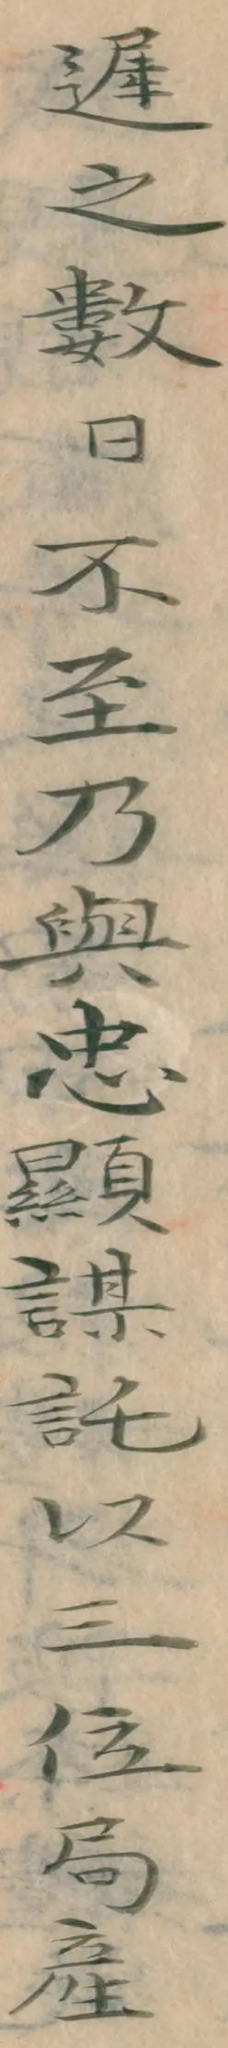遅之数日不至乃与忠顕謀託以三位局産
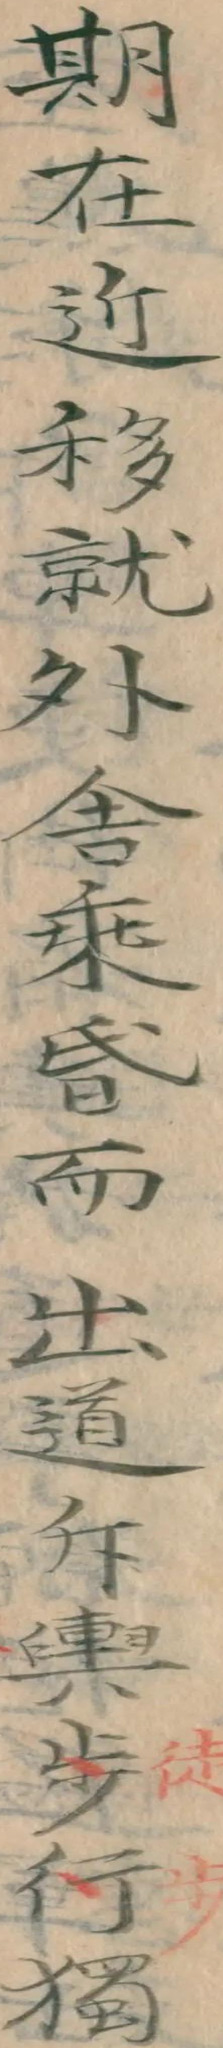期在近移就外舎乗昏而出道斥輿歩行徒歩独
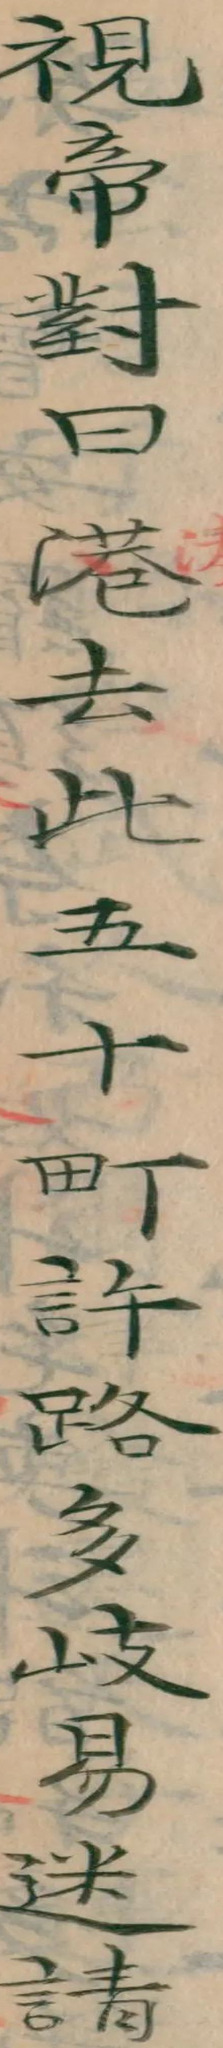視帝対曰湊去此五十町許路多岐易迷請
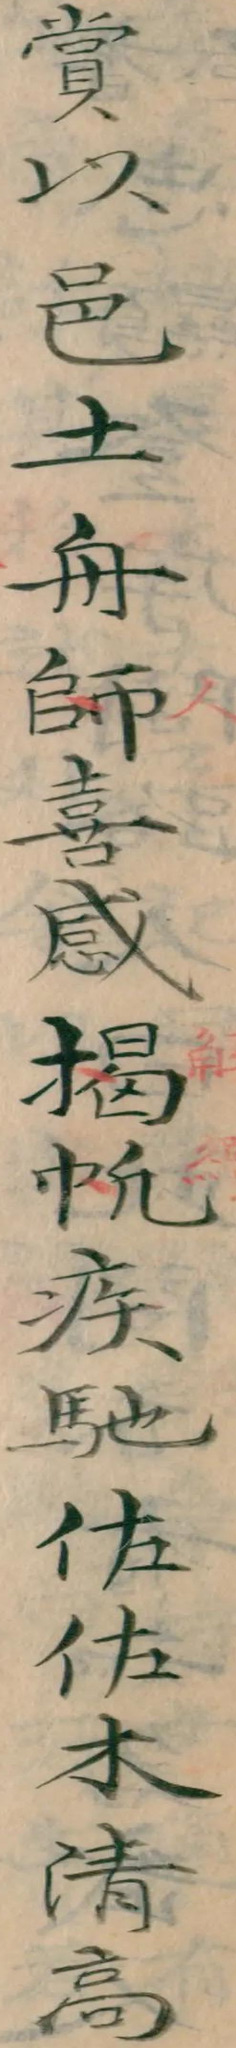賞以邑土舟師人喜感掲帆解纜疾馳佐佐木清高
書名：輪池叢書. 12
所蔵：国立国会図書館 National Diet Library, JAPAN
